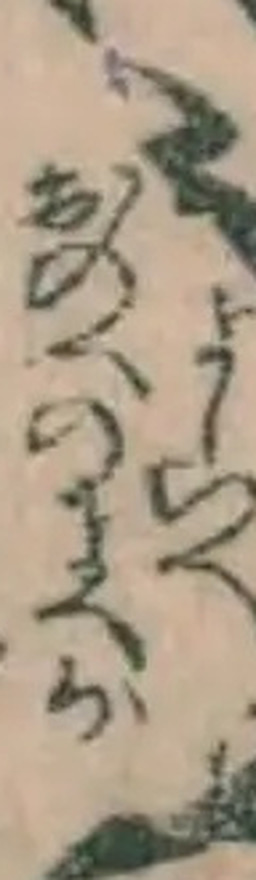おのへのまへが
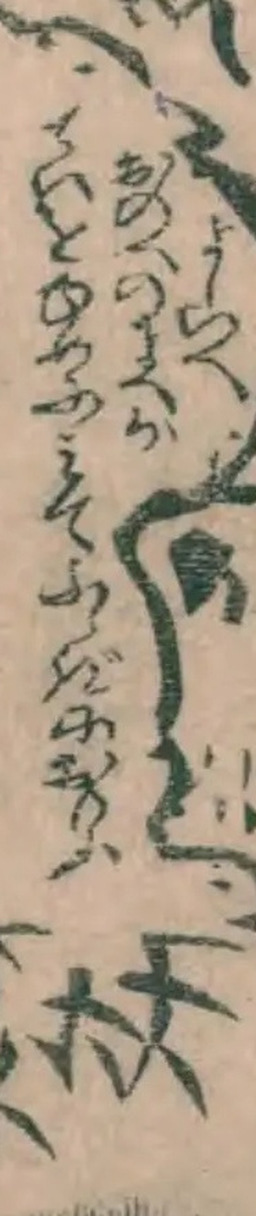ていをゆめにみてふしぎにおもふ
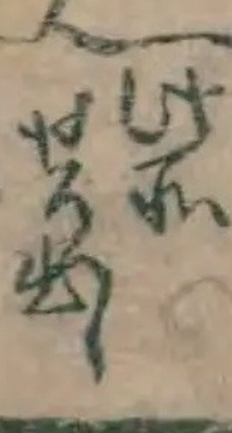せり出し
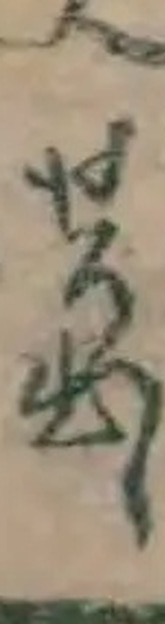せり出し
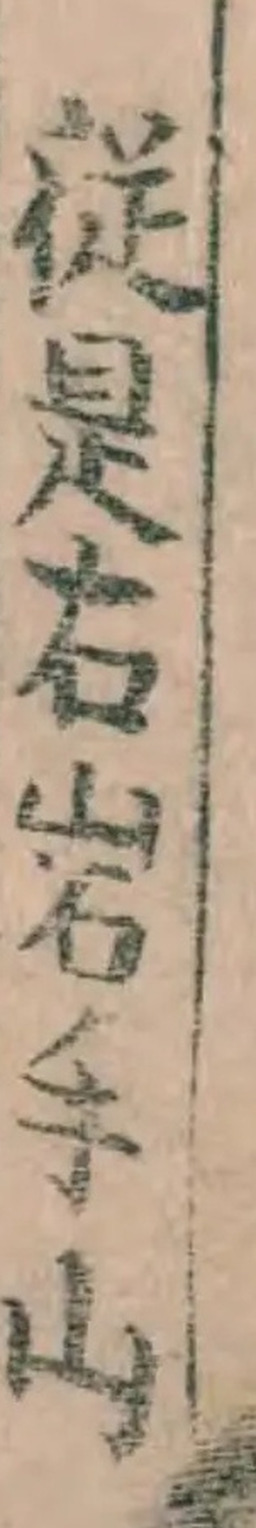従是右岩手山
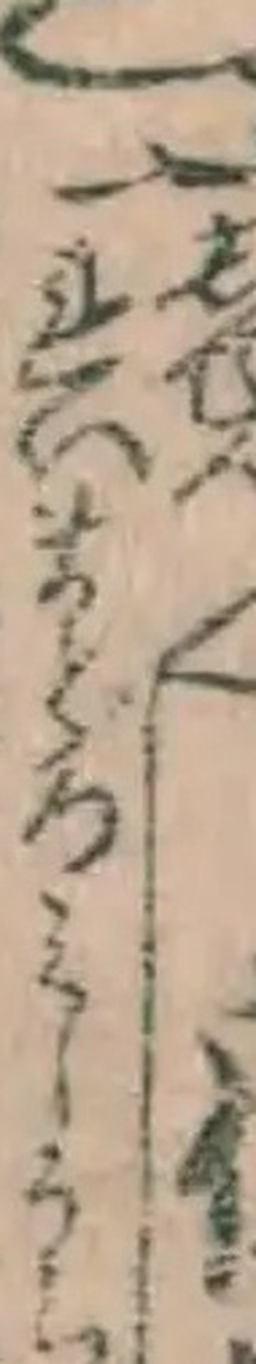れいまどろみしうち
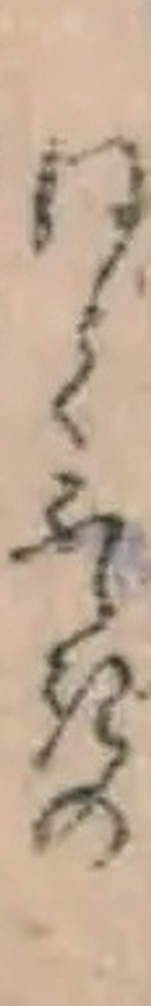同しくふしぎの
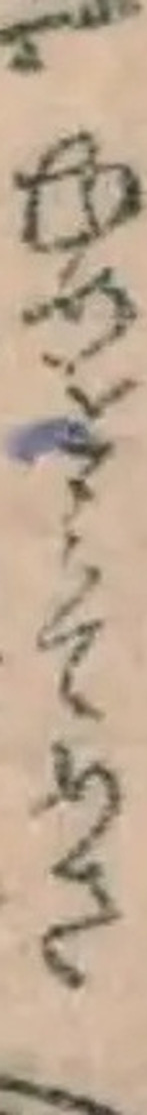ゆめをみてめさ
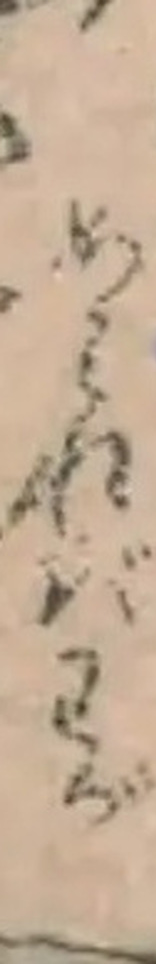めてみればわが
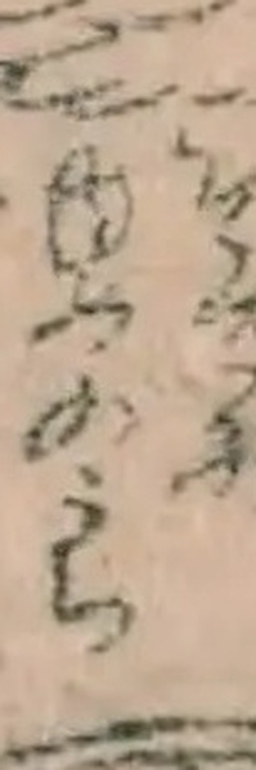ゆめのうち
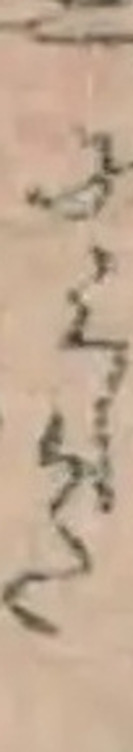にみしかた
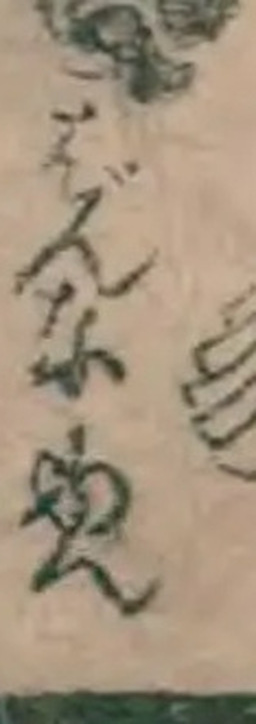ばんなゆん
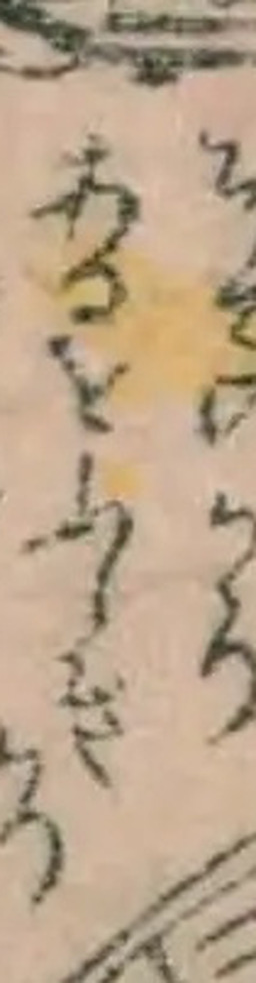あるをふしぎかり
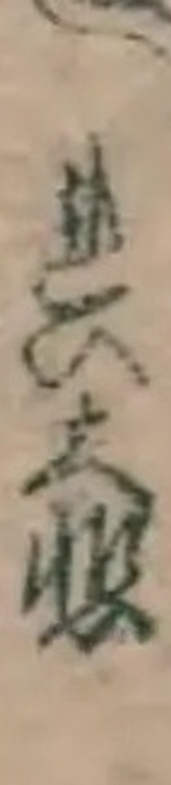れい大悲
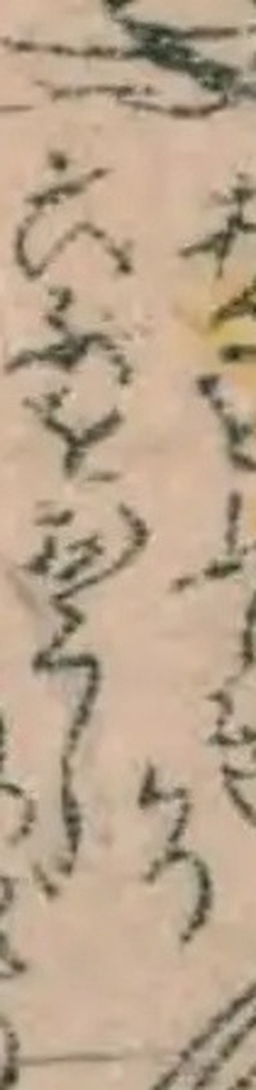六ぶをおこし
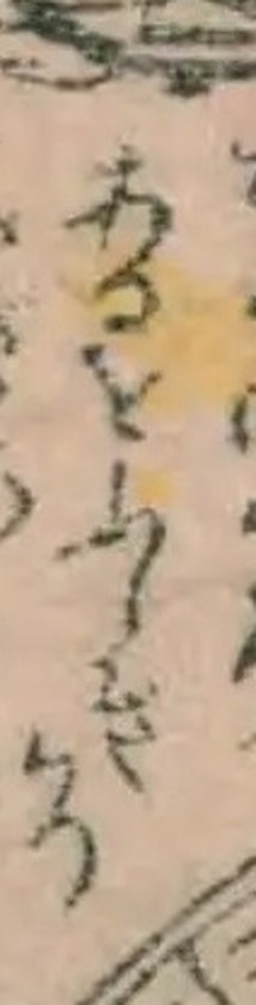あるをふしぎかり
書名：伊達錦對将 : 森田座
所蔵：国立国会図書館 National Diet Library, JAPAN
